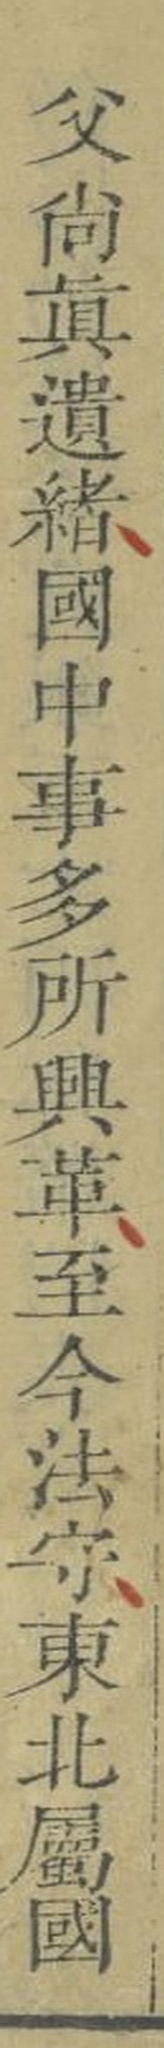父尚真遺緒国中事多所興革至今法守東北属国
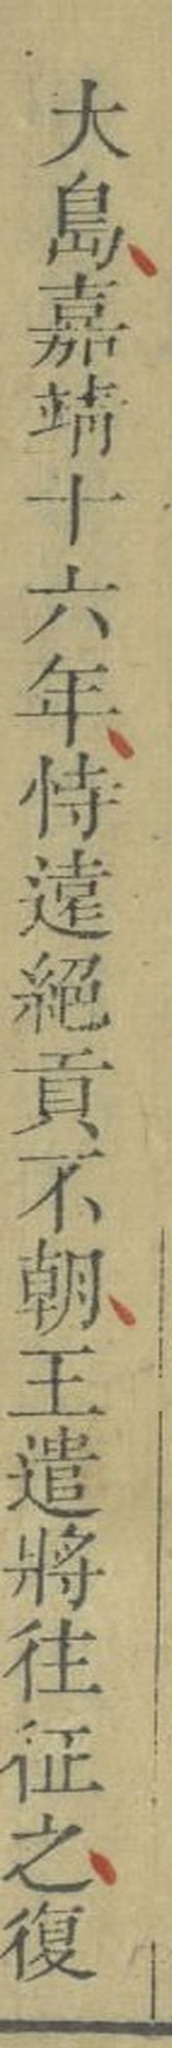大島嘉靖十六年恃遠絶貢不朝王遣将往征之復
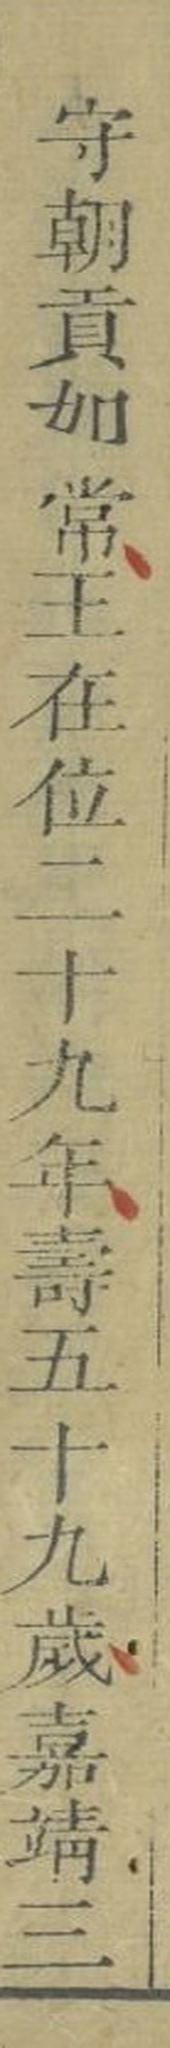守朝貢如常王在位二十九年寿五十九歳嘉靖三
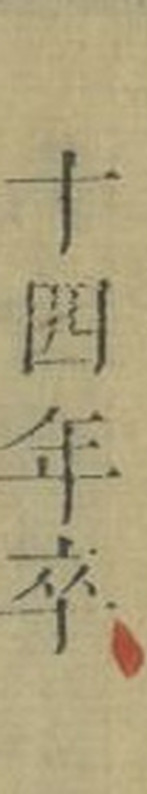十四年卒
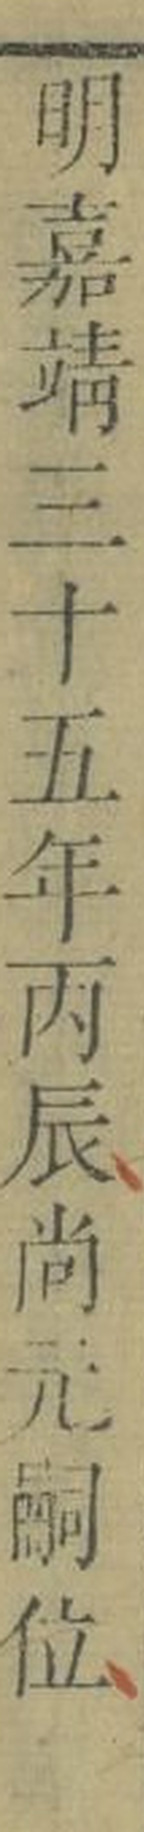明嘉靖三十五年丙辰尚元嗣位
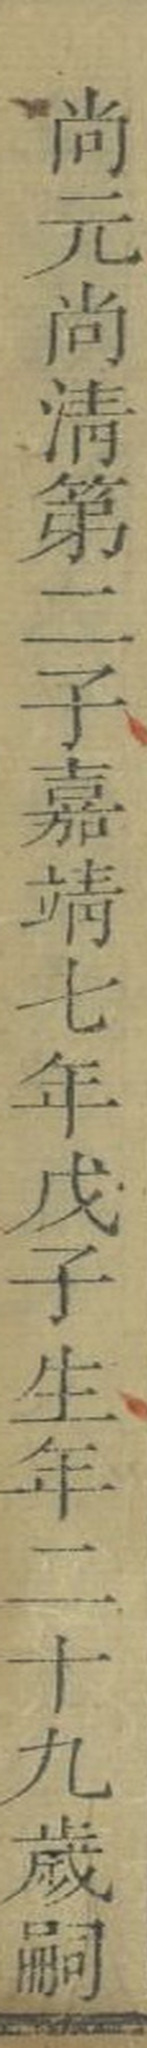尚元尚清第二子嘉靖七年戌子生年二十九歳嗣

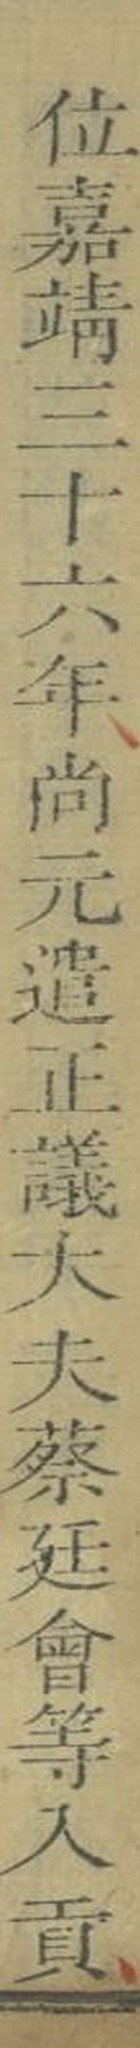位嘉靖三十六年尚元遣正議大夫蔡廷会等入貢
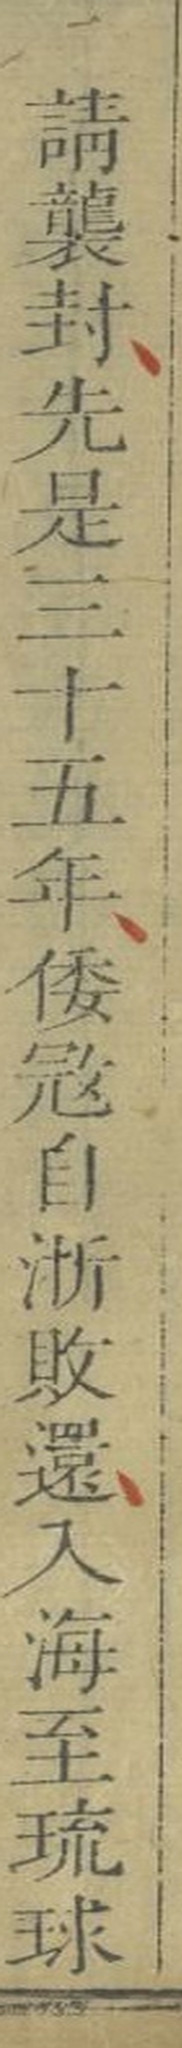請襲封先是三十五年倭寇自浙敗還入海至琉球
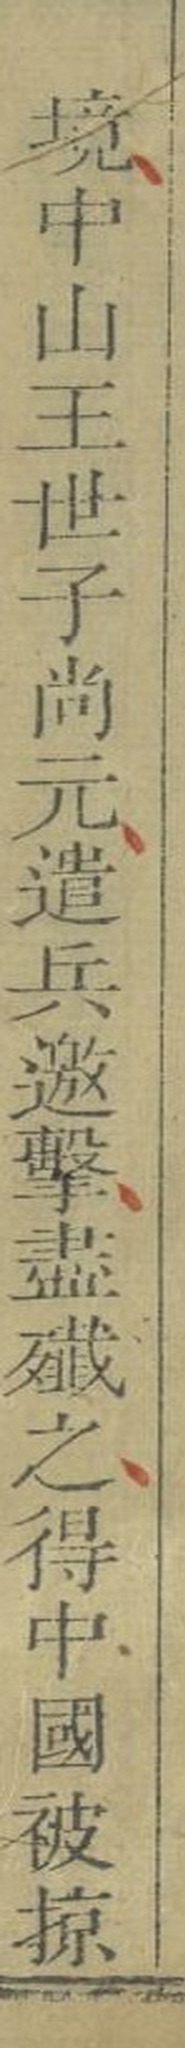境中山王世子尚元遣兵邀撃尽殲之得中国被掠
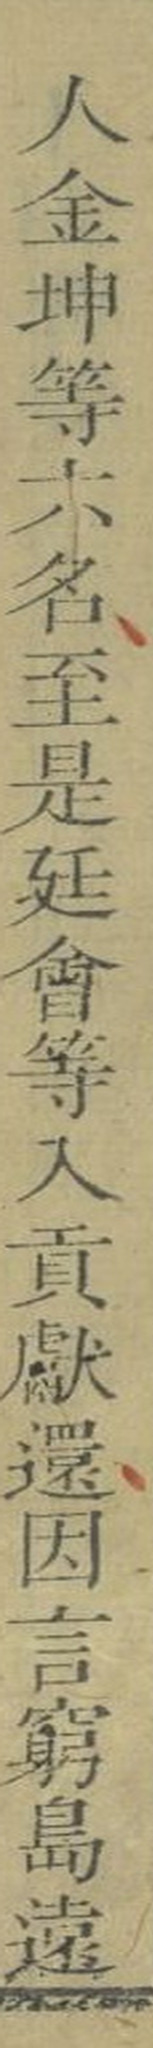人金坤等六名至是廷会等入貢献還因言窮島遠
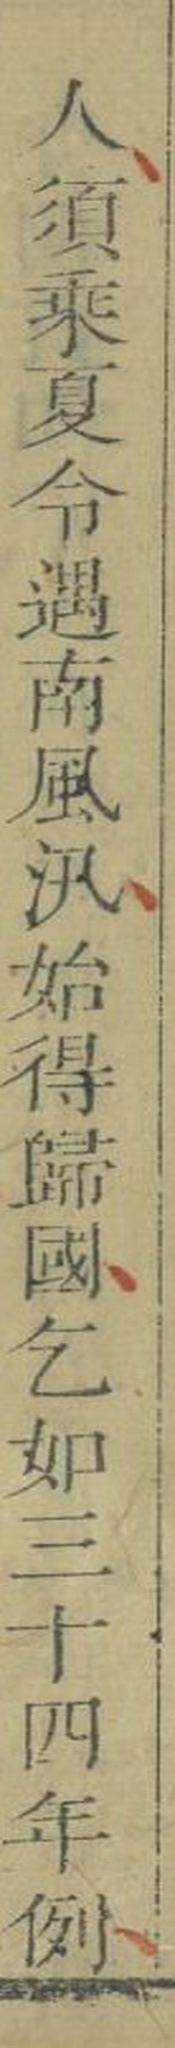人須乗夏令遇南風汛始得帰国乞如三十四年例
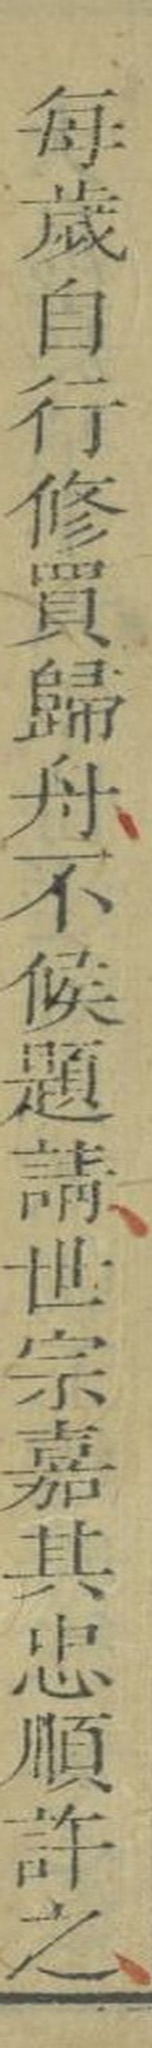毎歳自行修買帰舟不候題請世宗嘉其忠順許之
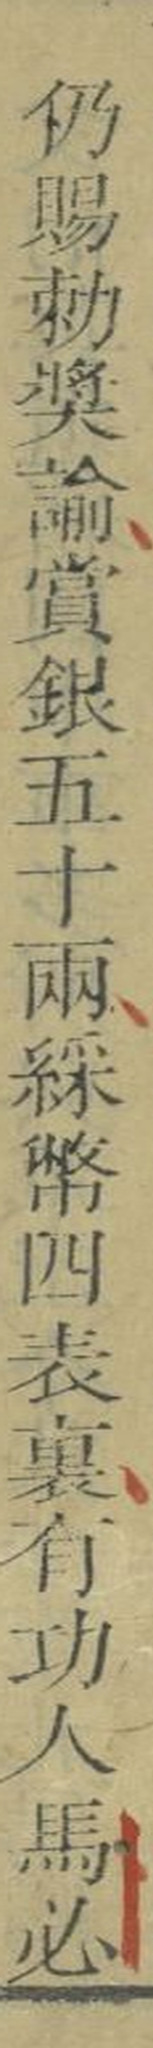仍賜勅奨諭賞銀五十両綵幣四表裏有功人馬必
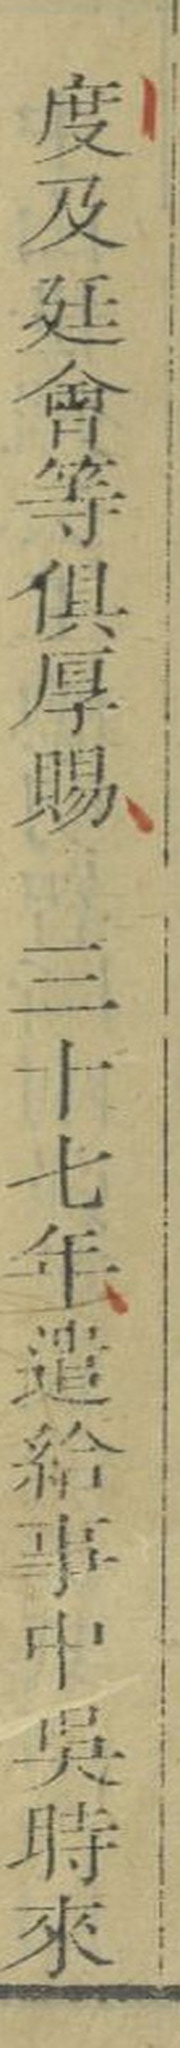度及廷会等俱厚賜三十七年遣給事中呉時来
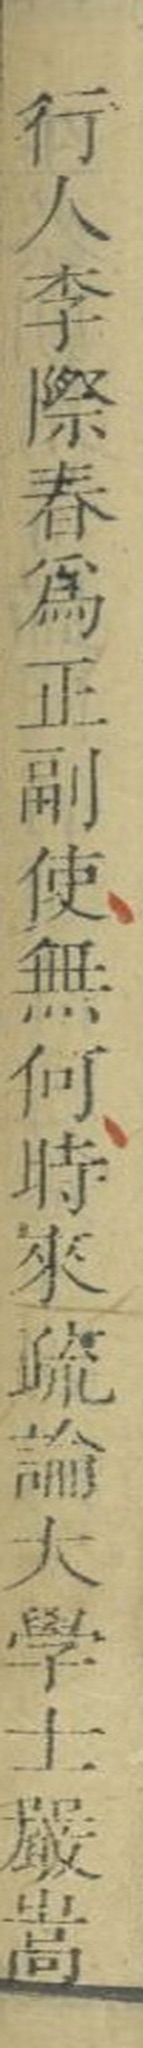行人李際春為正副使無何時来疏論大学士巌嵩
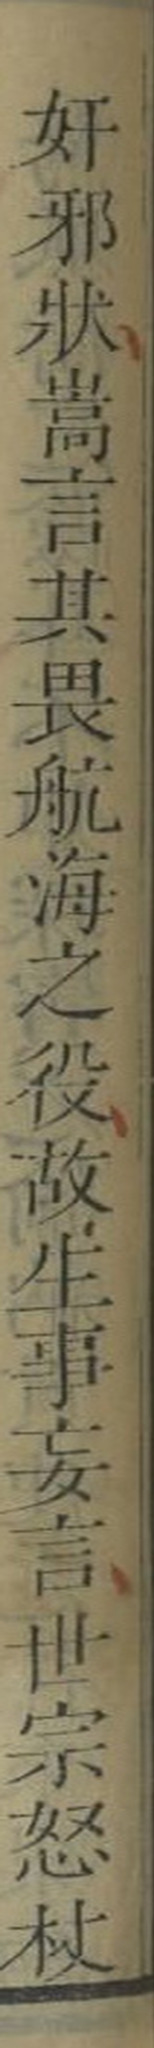奸邪状嵩言其畏航海之役故生事妄言世宗怒杖
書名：中山伝信録 巻三
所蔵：University of the Ryukyus Library
